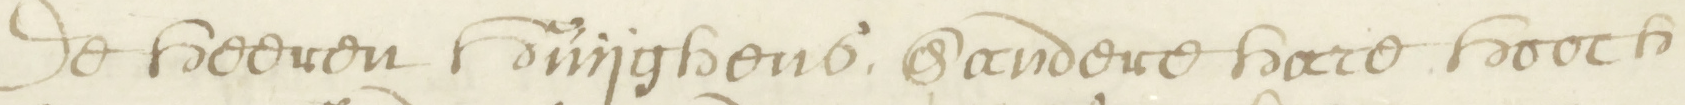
De heeren Huijghens, & andere hare Hooch
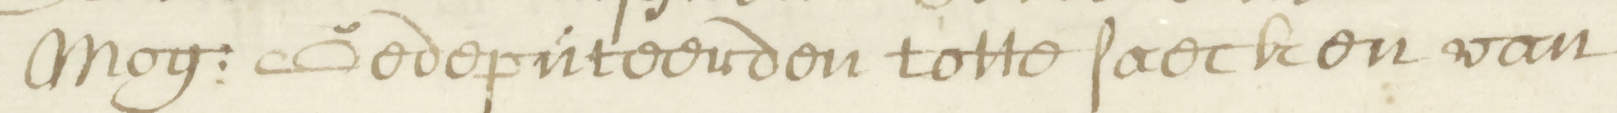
Mog: Gedeputeerden totte saecken van
